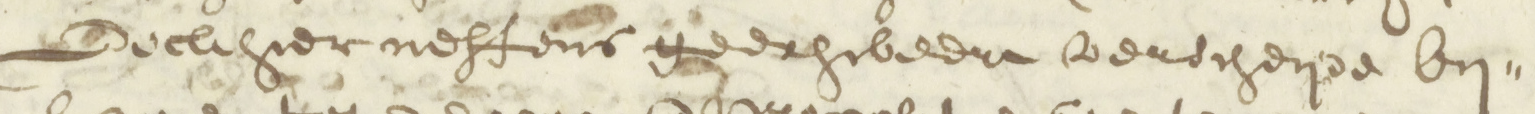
Oock hier neffens geexhibeert verscheijde by„
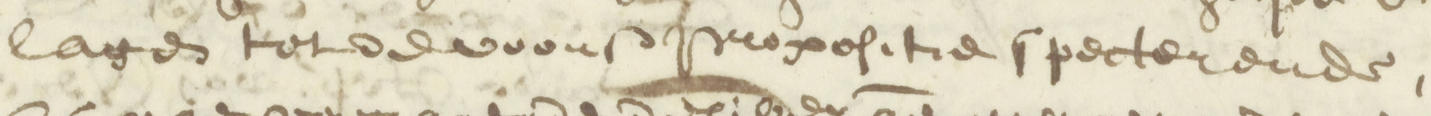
lagen tot de voors propositie specterende.
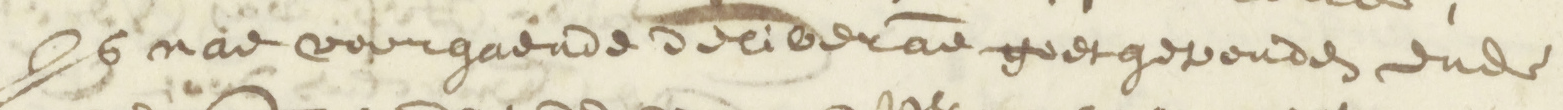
Is nae voorgaende deliberae goetgevonden ende
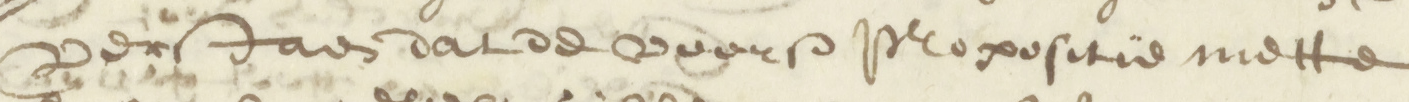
verstaen dat de voors Propositie mette
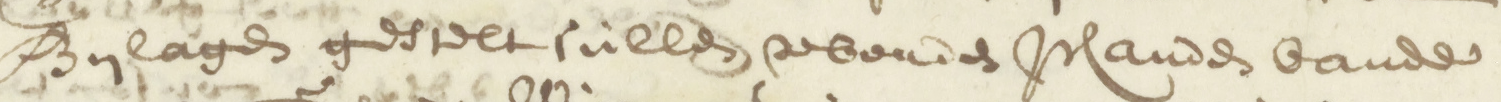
Bylagen gestelt sullen werden In handen vande
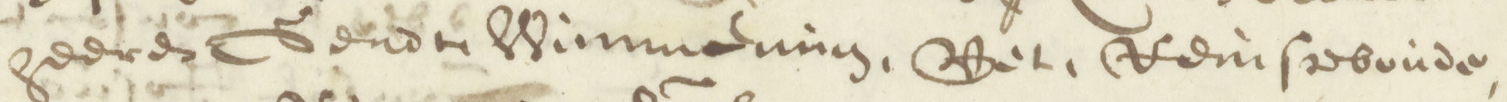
heeren Gendt, Wimmenum, Vet, Reinswoude
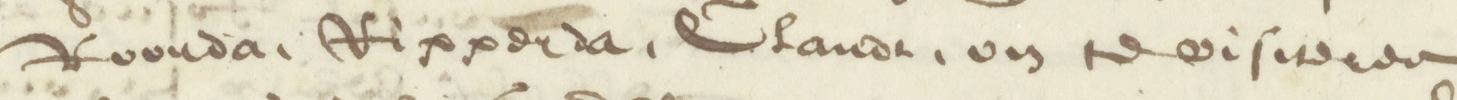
Roorda, Ripperda, Clandt, om te visiteren
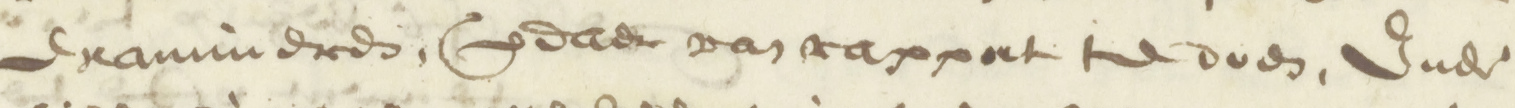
Examineren, & daer van rapport te doen. Ende
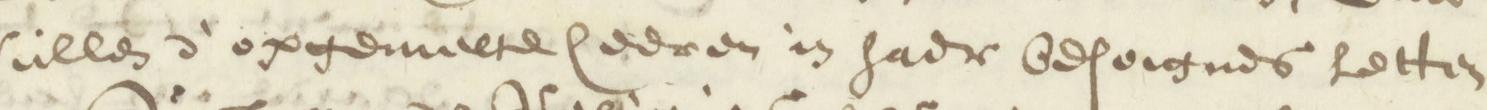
sullen d'opgemelte heeren in haer besoignes letten
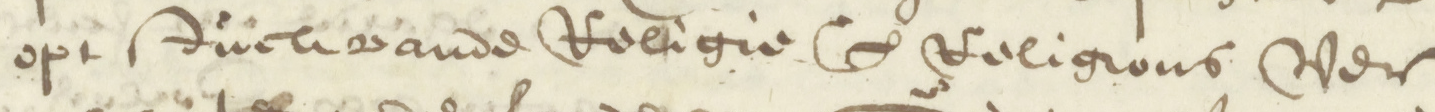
opt stuck vande Religie & Religions Ver„
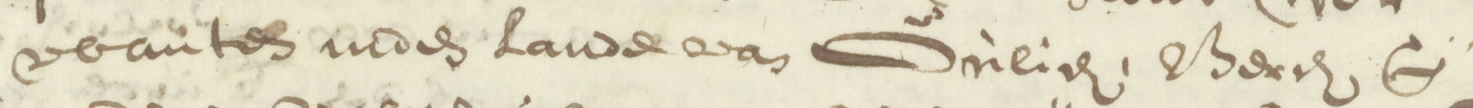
wanten inden Lande van Gulich, Berch &
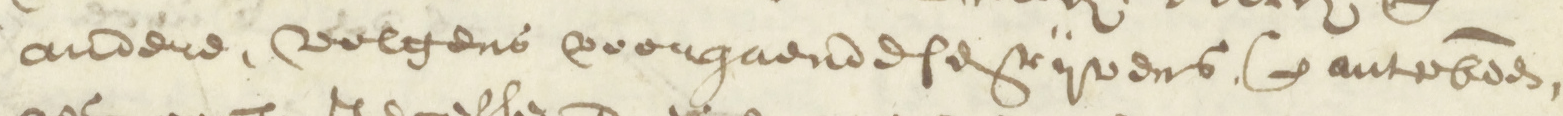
andere, volgens voorgaende schrijvens, & antwden.
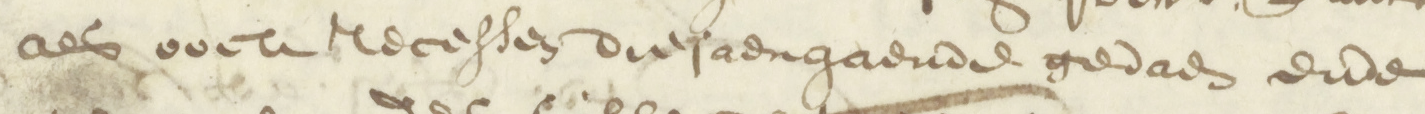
als oock recessen diesaengaende gedaen ende
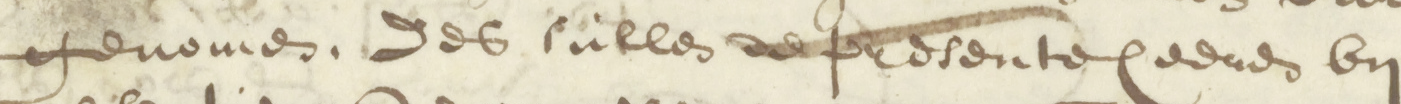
genomen. Des sullen de presente heeren by
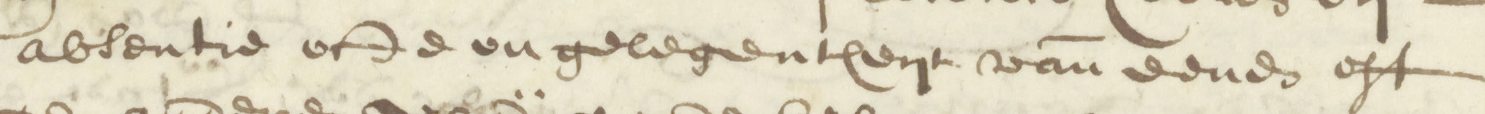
absentie ofte ongelegentheyt van eenen off
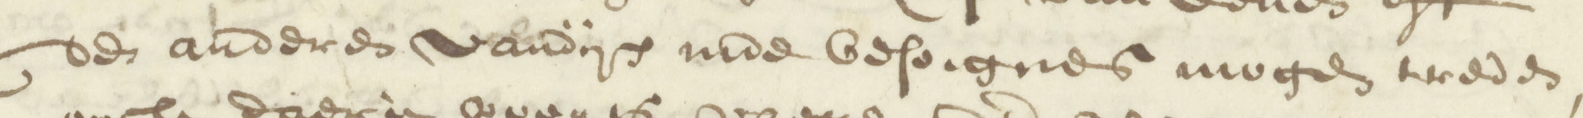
den anderen vandijen inde besoignes mogen treden,
